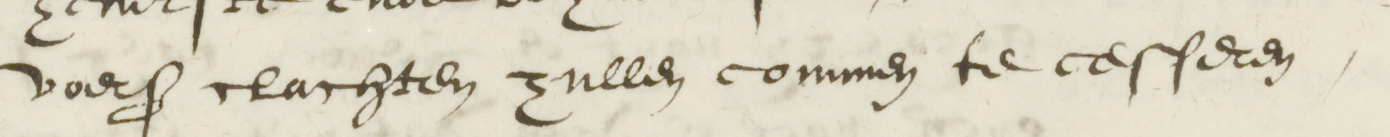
voers clachten zullen commen te cesseren.
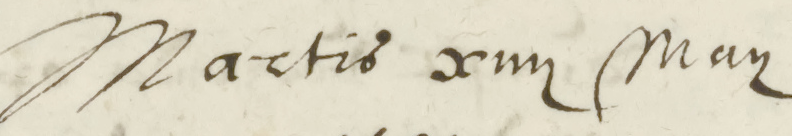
martis xiiii May
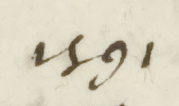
1591
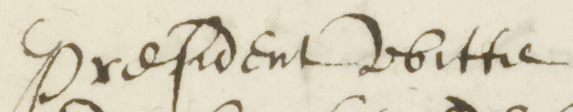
President Witte
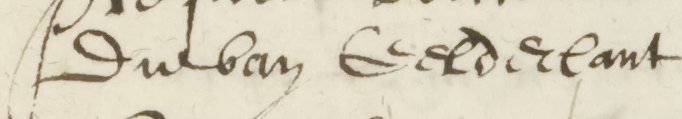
Die van Gelderlant
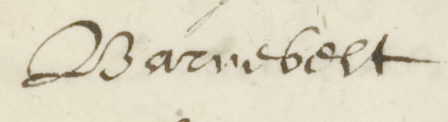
Barnevelt
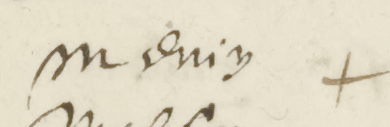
Menin
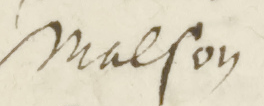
Malson
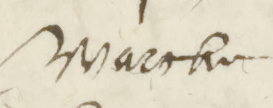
Warcke
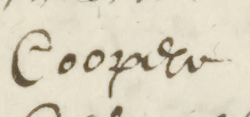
Coopere
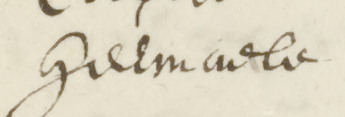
Heermaele
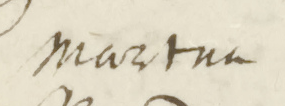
Martna
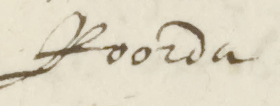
Roorda
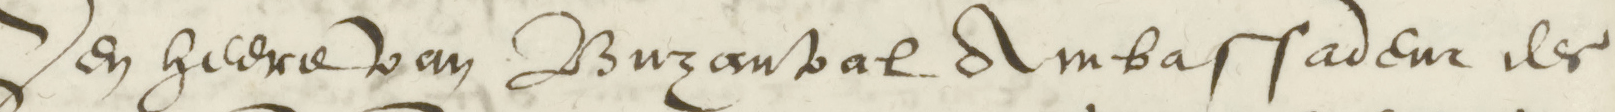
Den heere van Buzanval Ambassadeur des
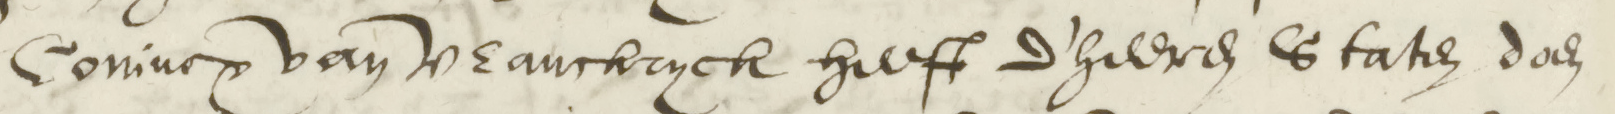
conincx van Vranckryck heeft d'heeren Staten doen
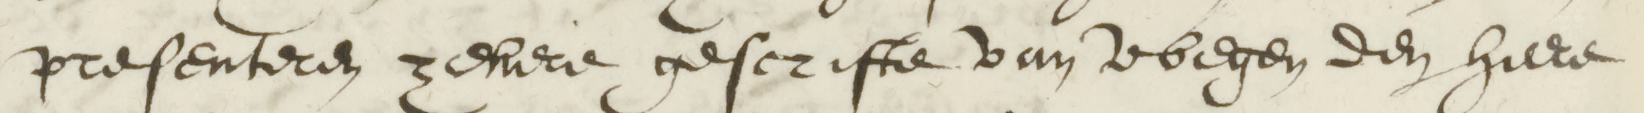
presenteren zekere gescrifte van wegen den heere
